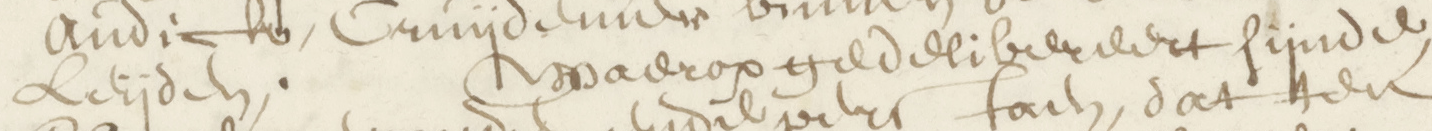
Leijden; Waerop gedelibereert sijnde,
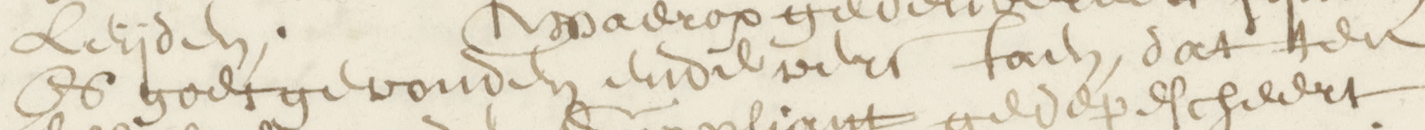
Is goetgevonden ende verstaen, dat ten
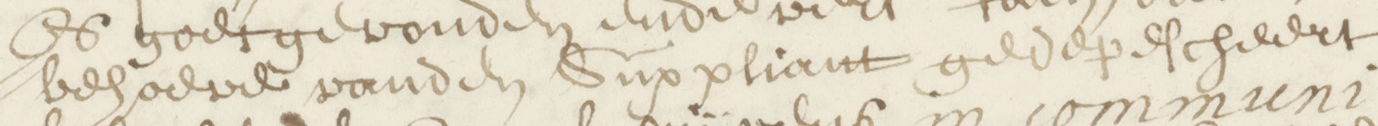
behoeve vanden Suppliant gedepescheert
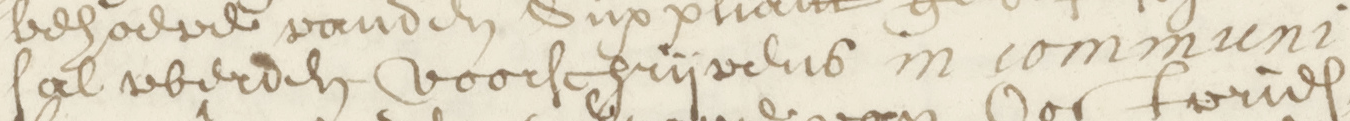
sal werden voorschrijvens in communi
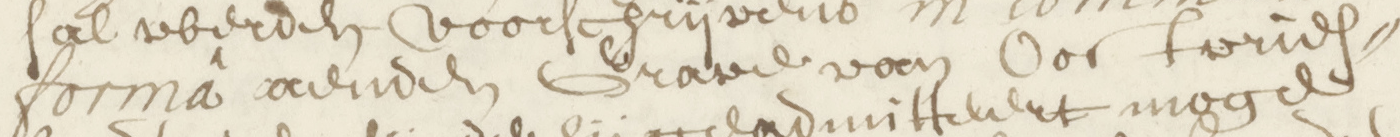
forma aenden Grave van Oostvries„
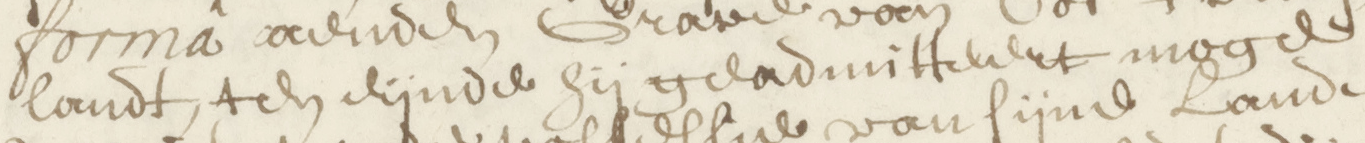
landt, ten eijnde hij geadmitteert moge
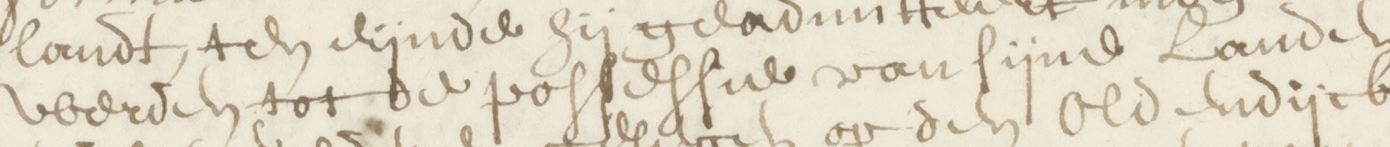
werden tot de possessie van sijne Landen
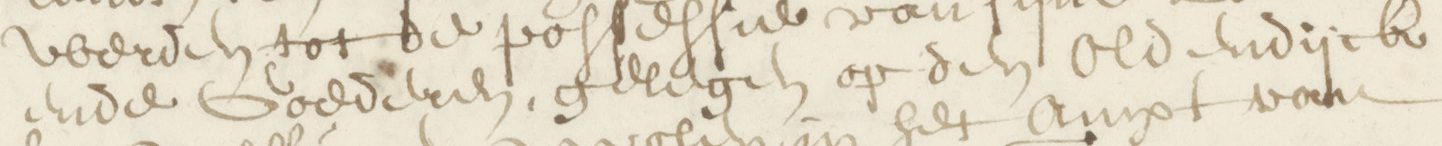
ende Goederen, gelegen op den Oldendijck
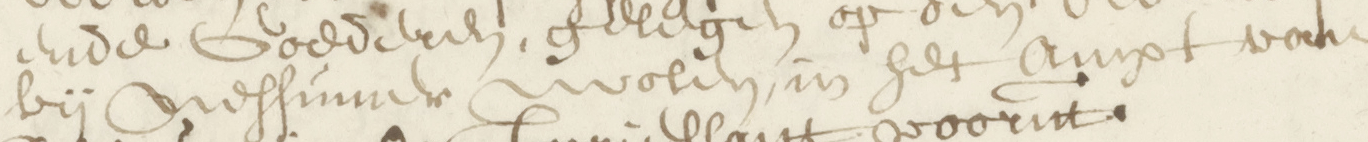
bij Nessumer Molen, in het Ampt van
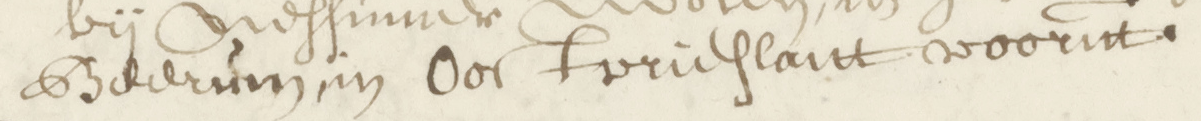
Beerum, in Oostvrieslant voornt.
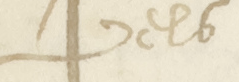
Pels
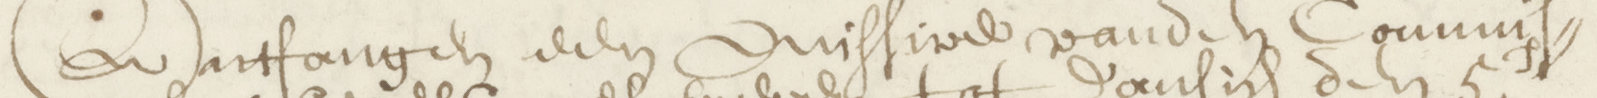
Ontfangen een Missive vanden Commis„
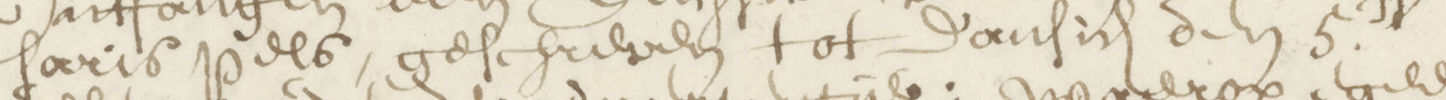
saris Pels, geschreven tot Dansich den 5en.
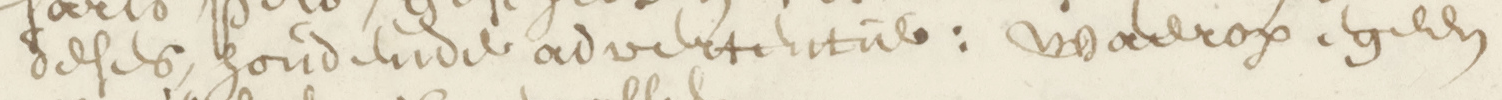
deses, houdende advertentie: Waerop egeen
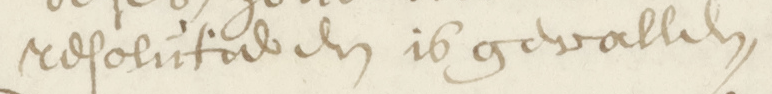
resolutie en is gevallen.
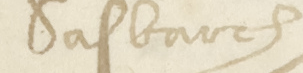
Sasburch
